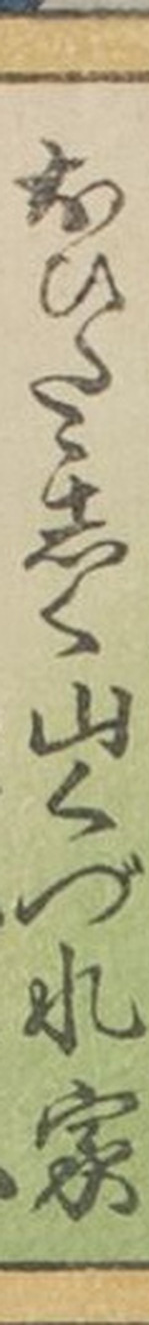おひたゝしく山くづれ家
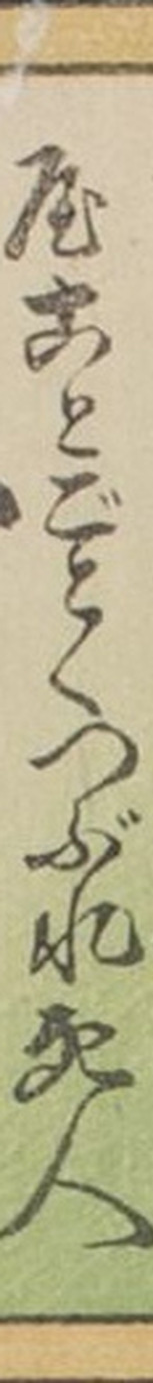屋ことごとくつぶれ死人
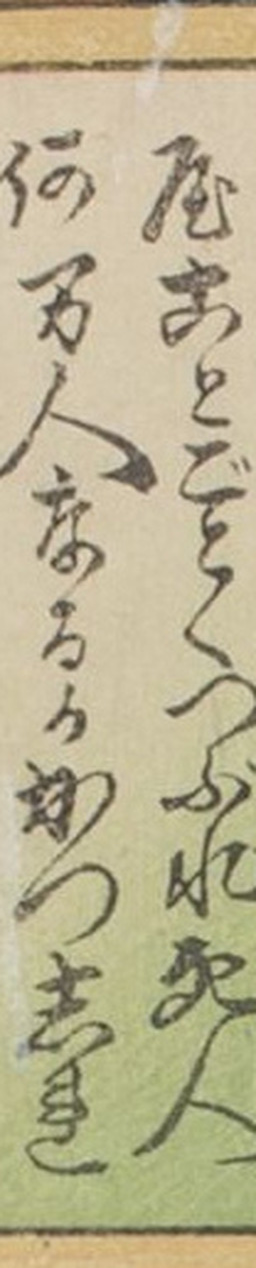何万人なるかかつしれ
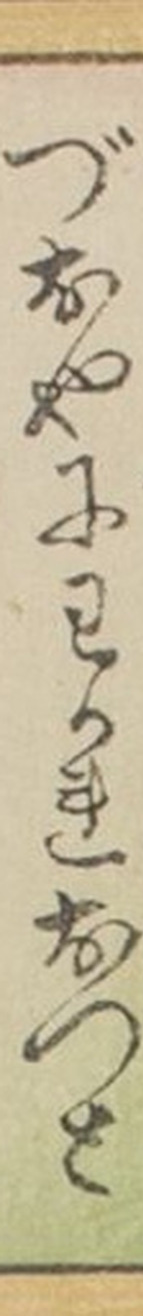づおやにわかれおつと
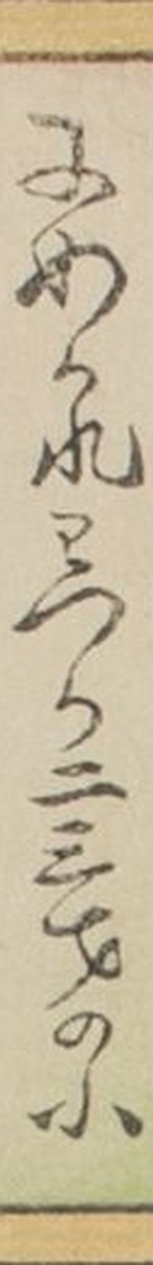にわかれわつか二三才の小
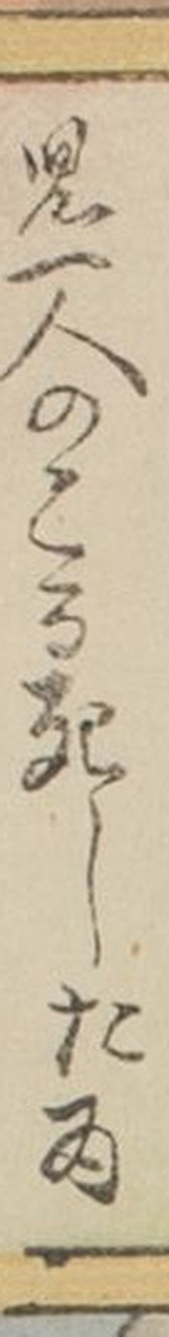児一人のこる死したる
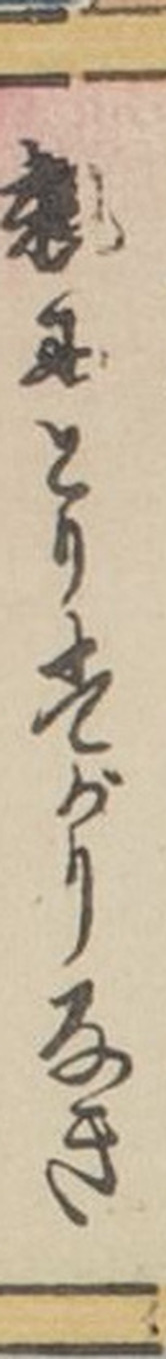親にとりすがりなき
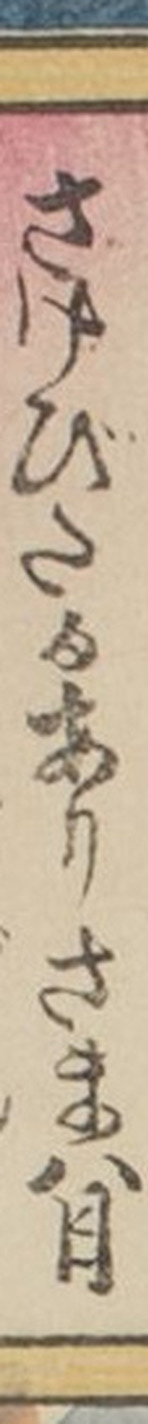さけびたるありさまは目
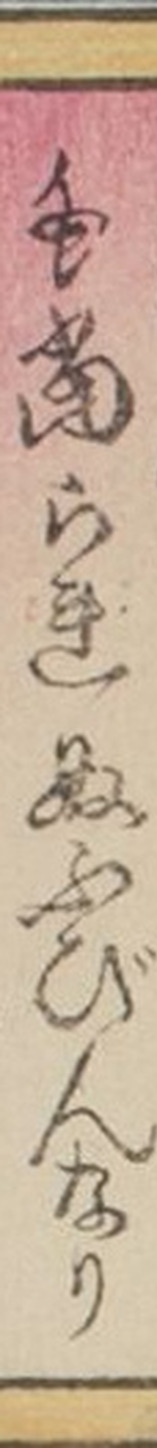も当られぬふびんなり
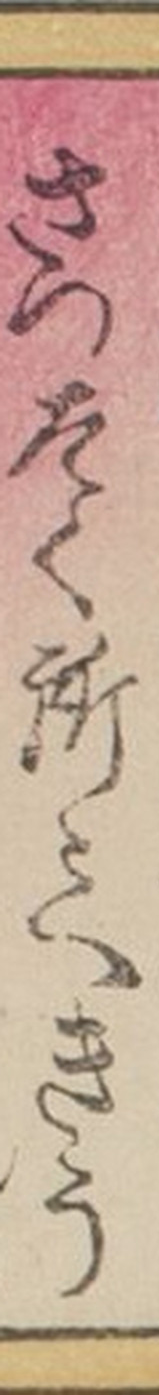さつそく所々へきう
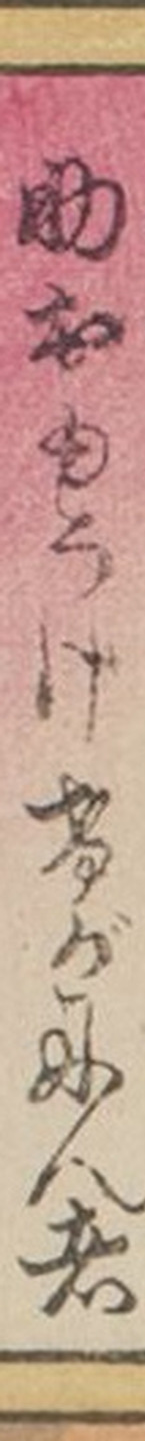助おもうけけがにんは
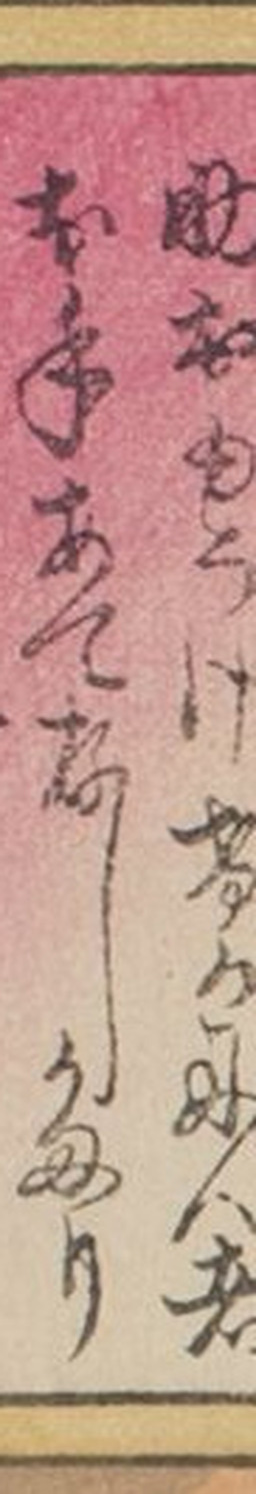お手あてなしたり
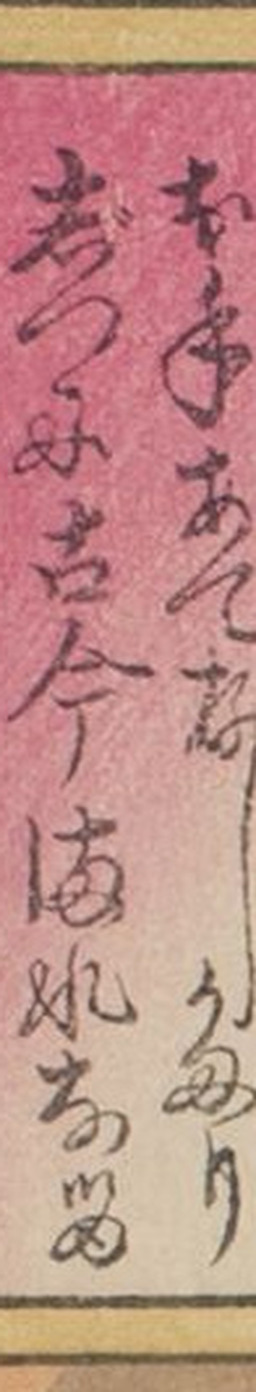じつに古今まれなる
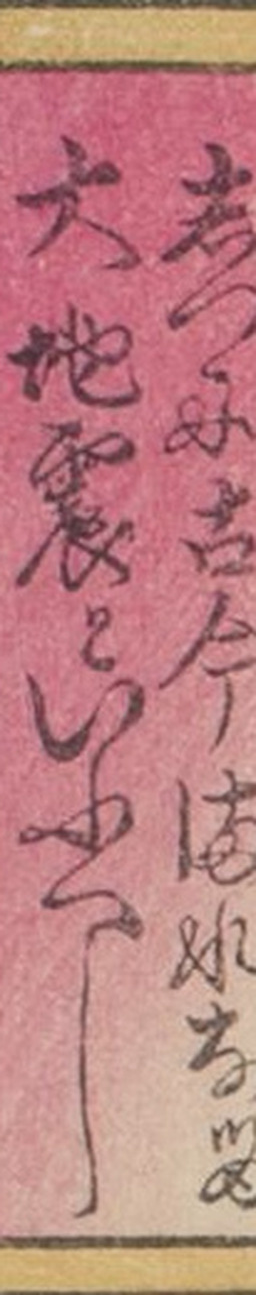大地震といふへし
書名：濃尾大地震後図
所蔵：あいおいニッセイ同和損保株式会社
